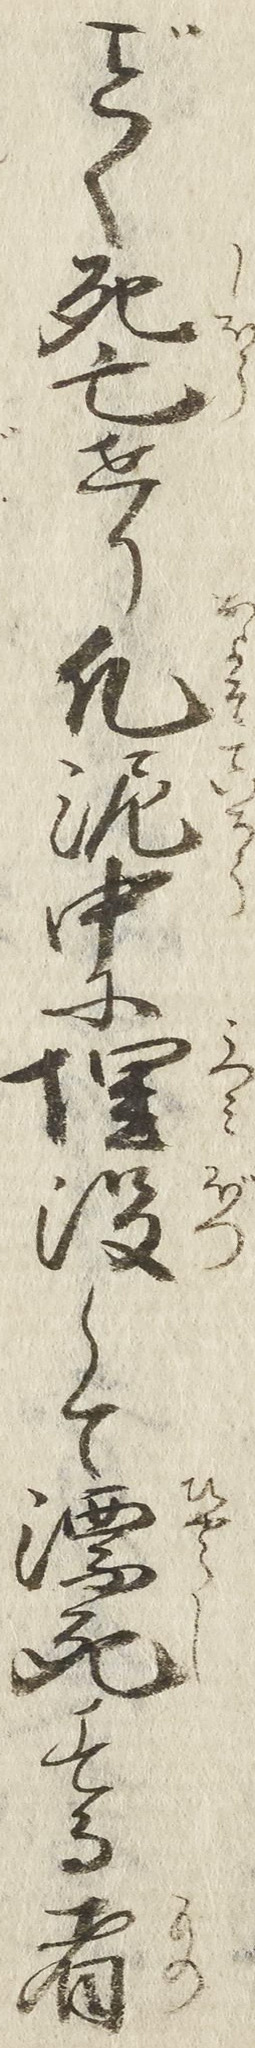ごとく死亡せり凡泥中に埋没して漂死する者
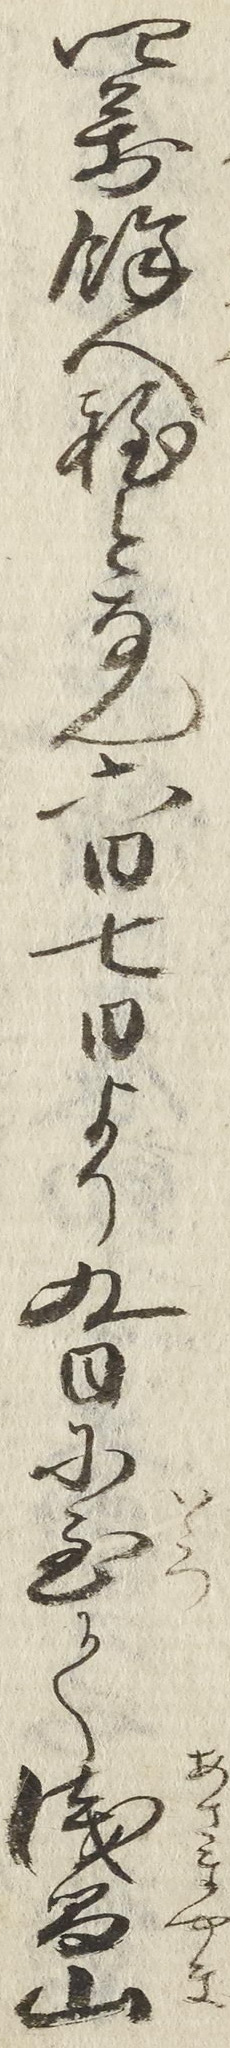四萬余人程となん六日七日より九日に至て浅間山
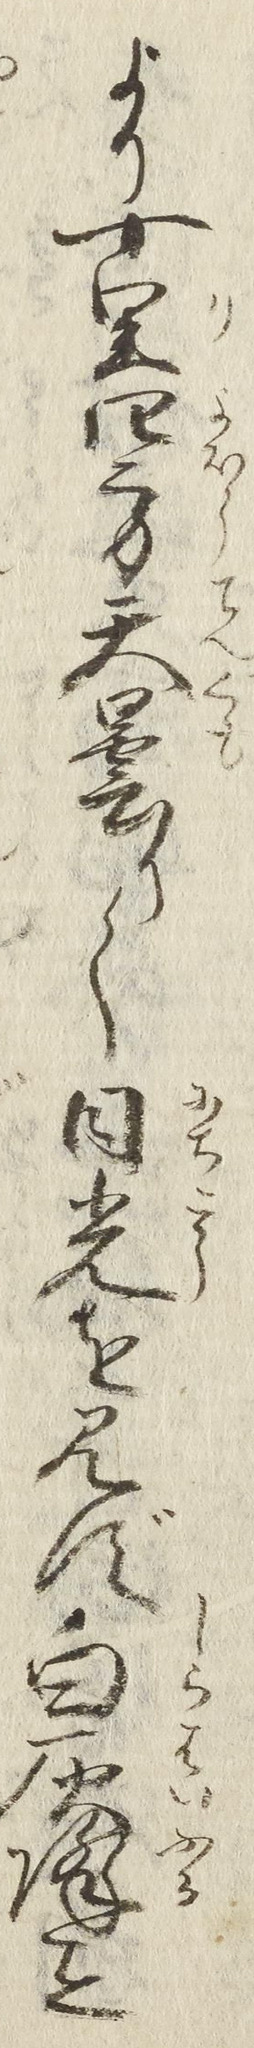より十里四方天曇りて日光を見ず白灰降こと
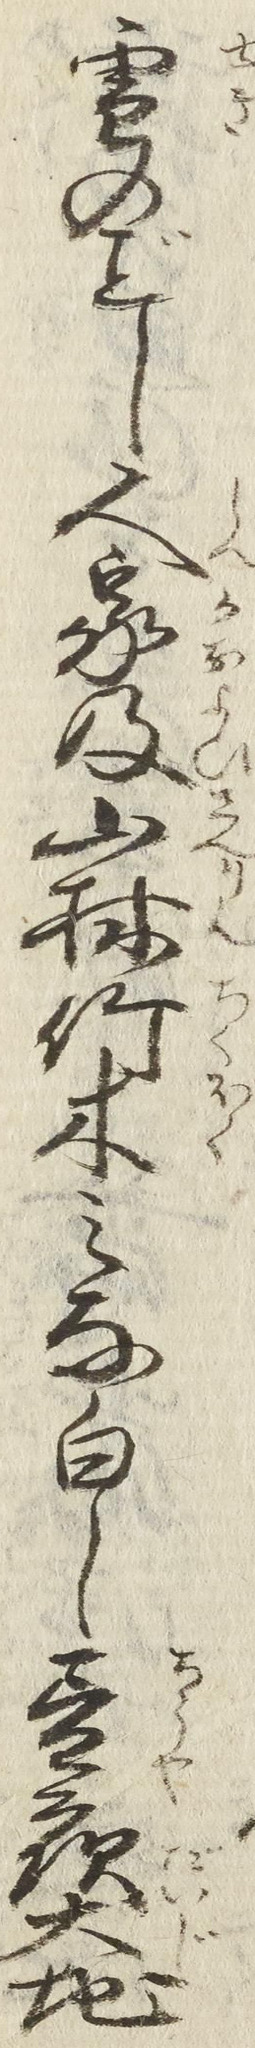雪のごとし人家及山林竹木みな白し昼夜大地
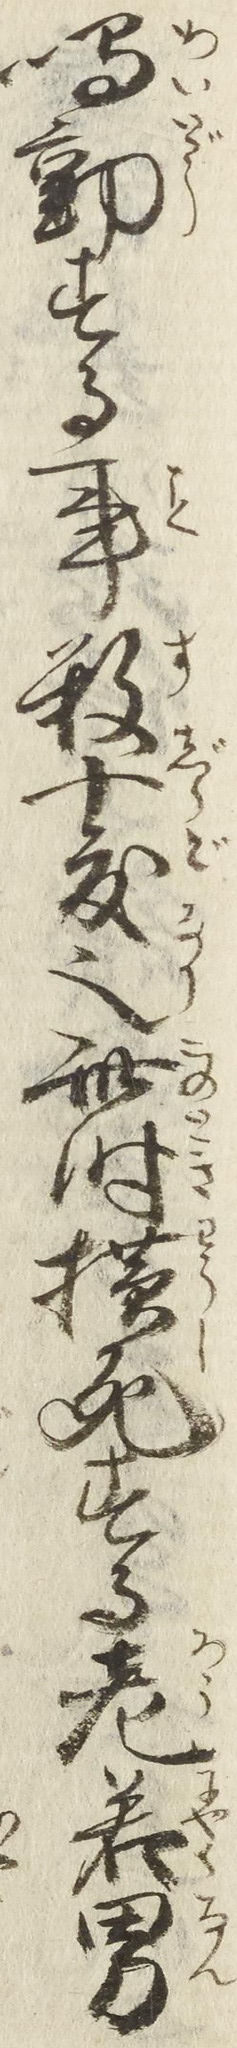鳴動する事数十度也此時横死する老若男
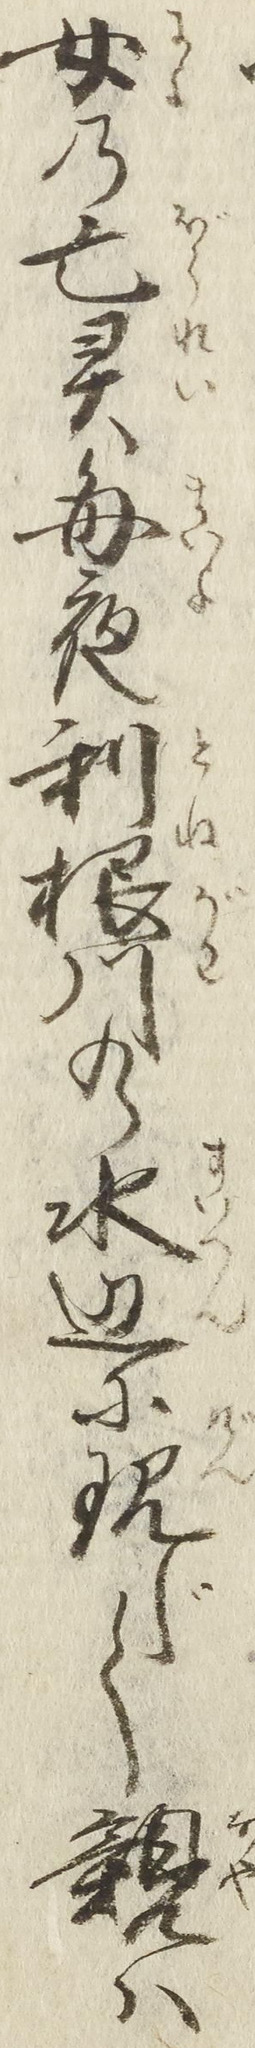女の亡霊毎夜利根川の水辺に現じて親は
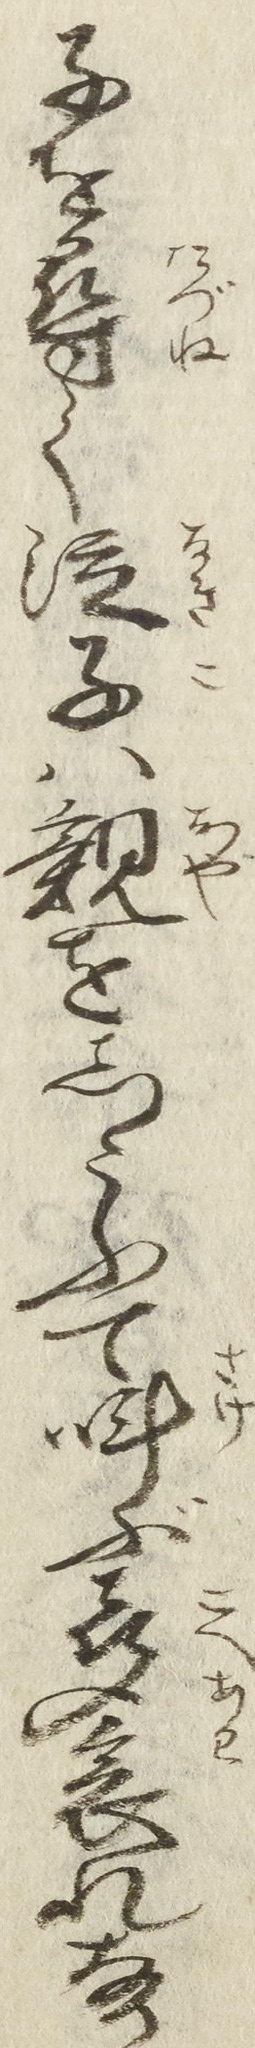子を尋て泣子は親をしたふて叫ぶ声哀れなり
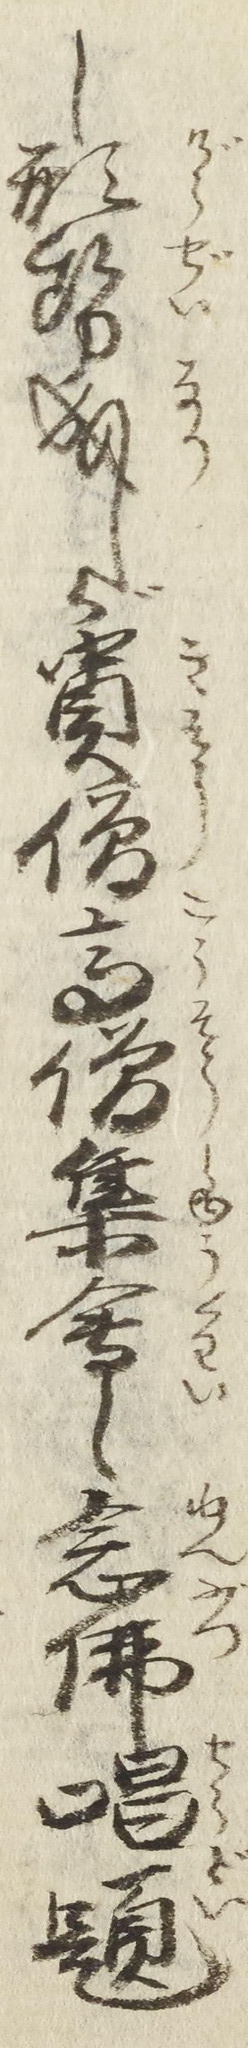し形勢成しが貴僧高僧集会し念佛唱題
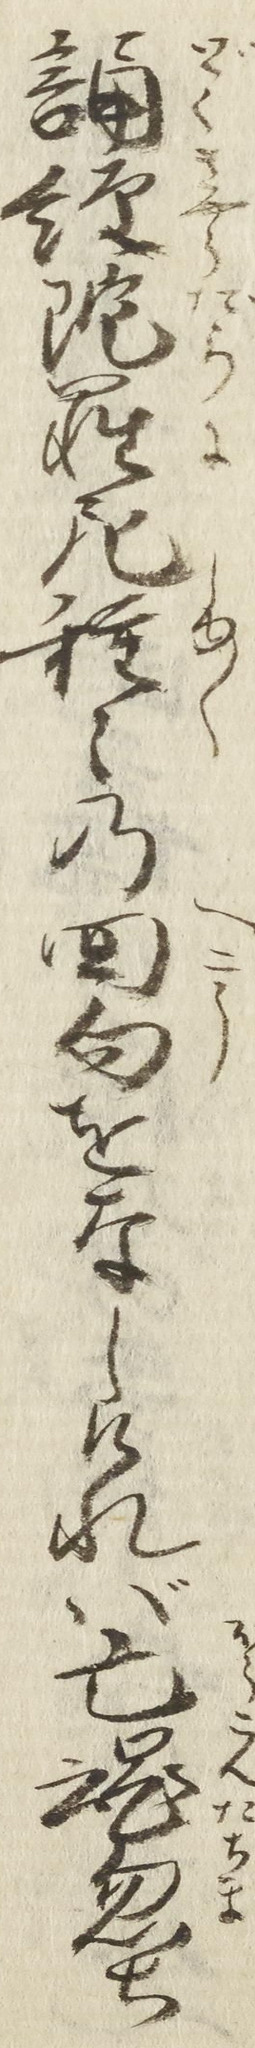誦経陀羅尼種〻の回向をなしければ亡魂忽ち
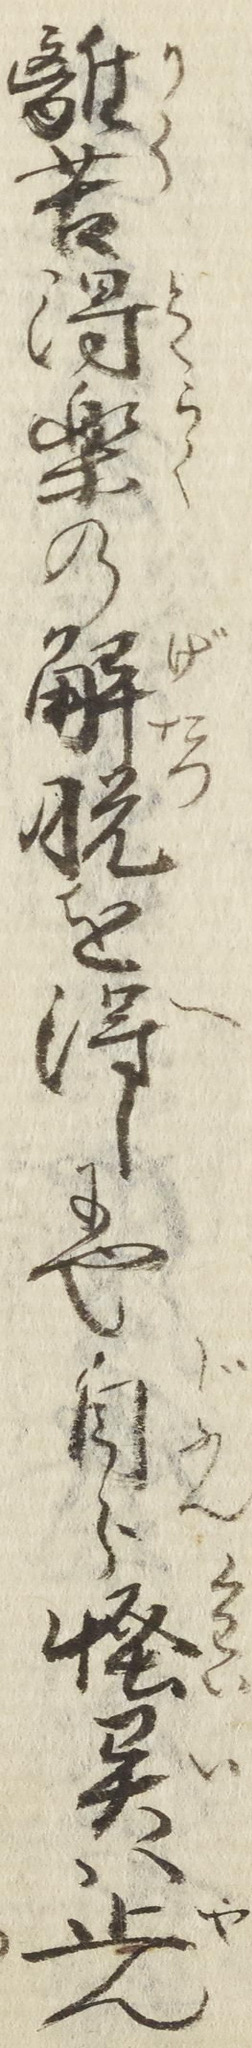離苦得楽の解脱を得しにや自分怪異は止ん
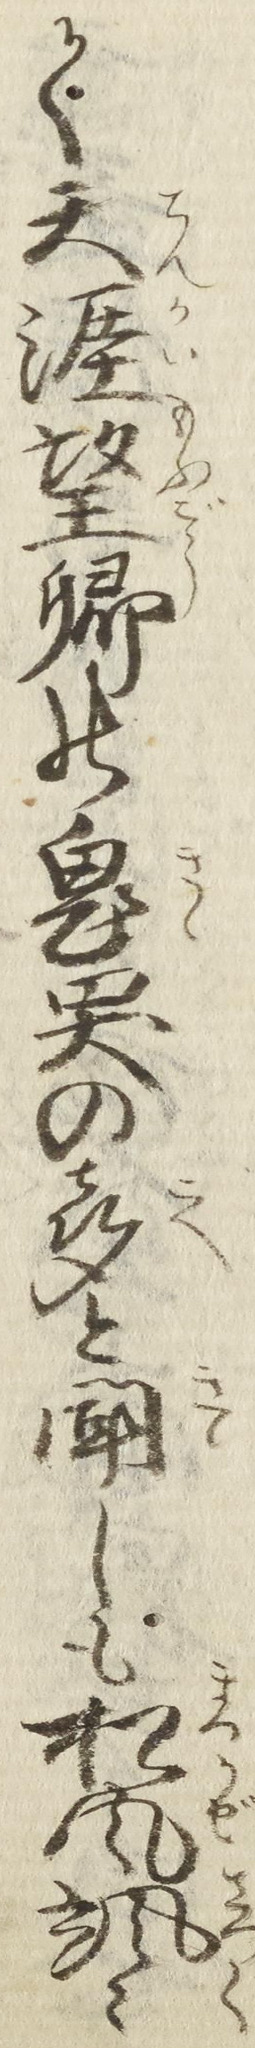で天涯望郷の鬼哭の声と聞しも松風颯〻
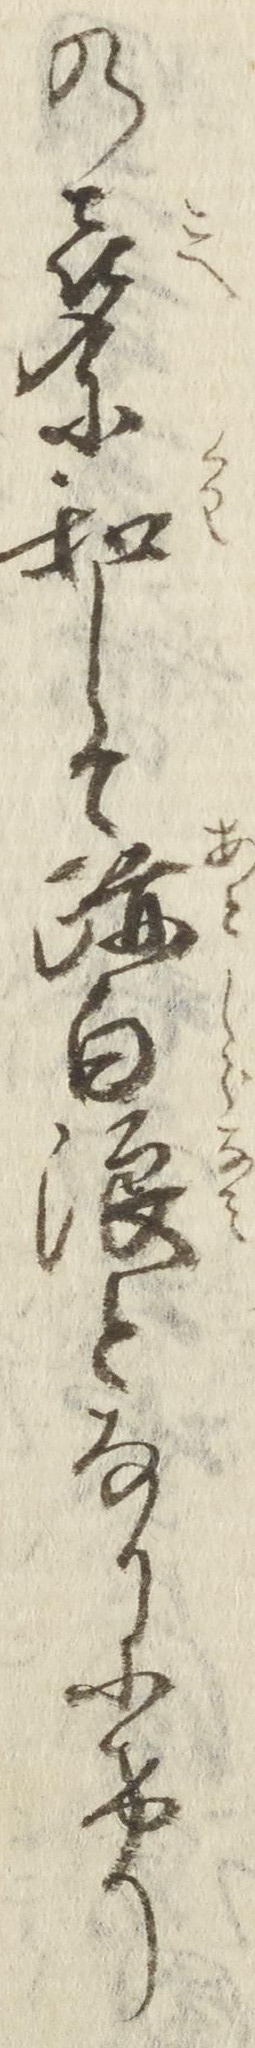の声に和して跡白浪となりにけり

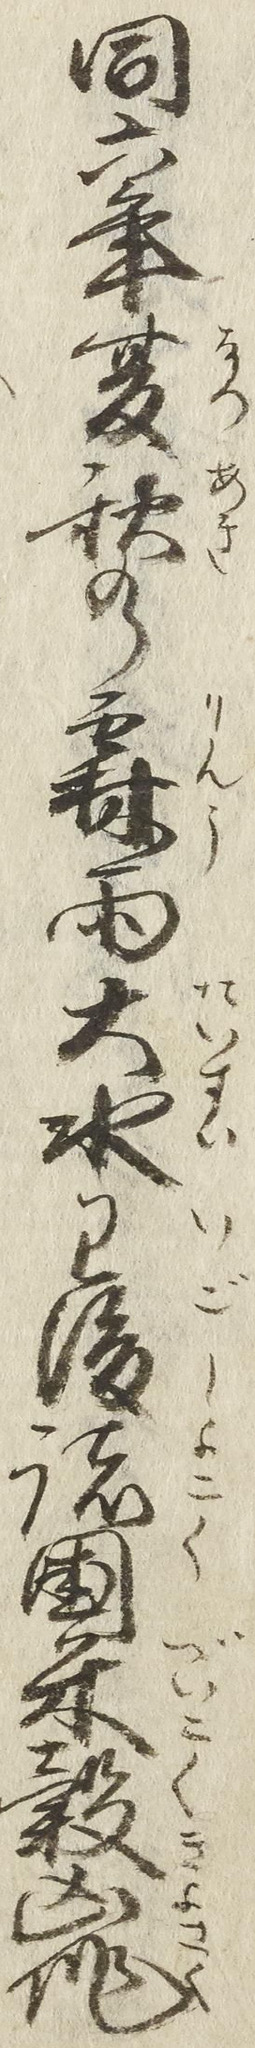同六年夏秋の霖雨大水已後諸国米穀凶作
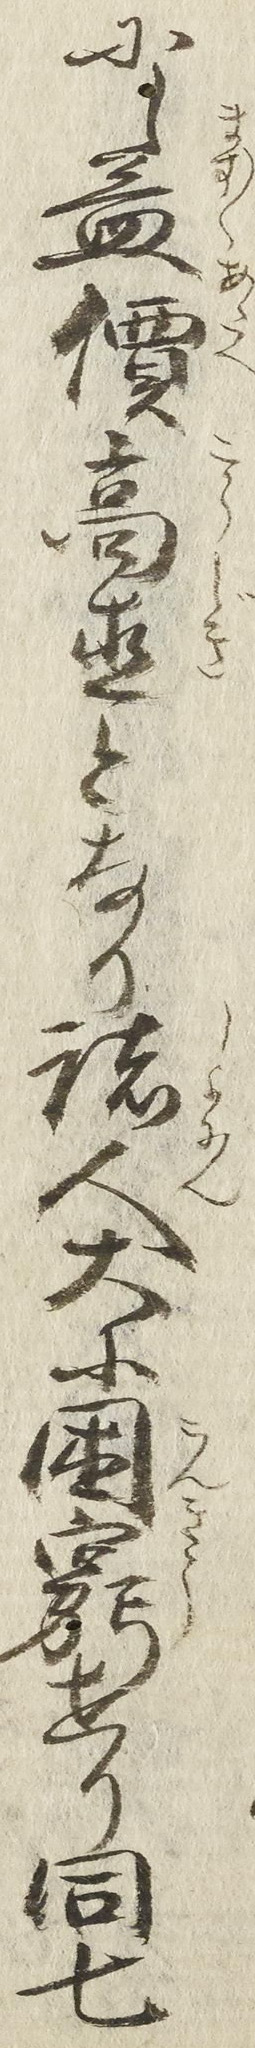にも益価高直となり諸人大に困窮せり同七
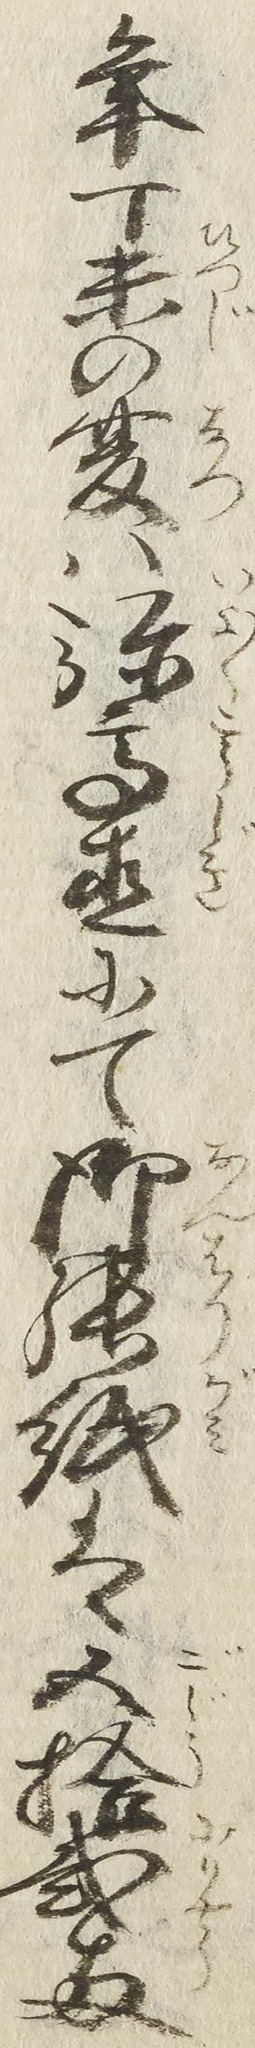年丁未の夏は弥高直にて御張紙は五拾弐両
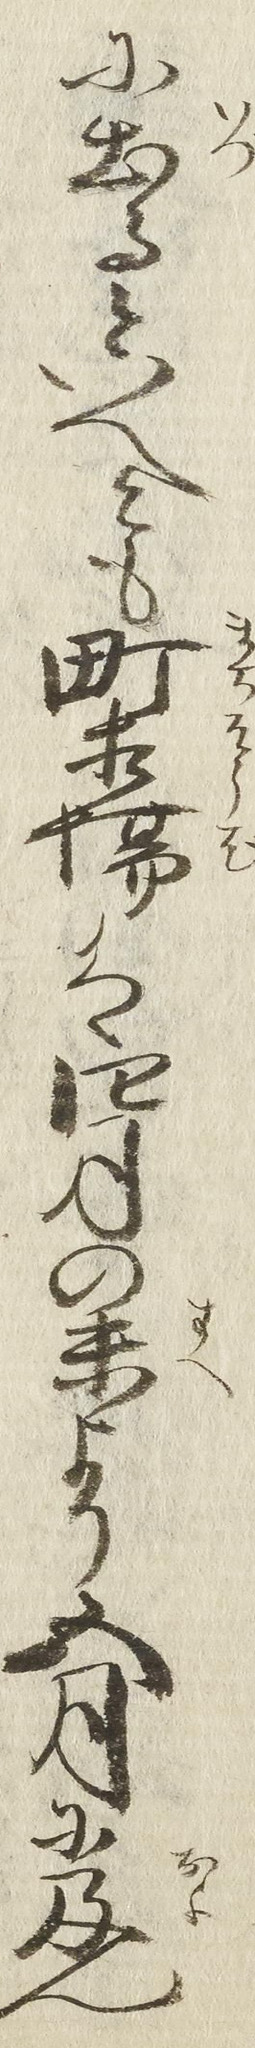に出るといへとも町相場は四月の末より五月に及ん
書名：天明奇畧　全
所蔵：東京大学地震研究所図書室 Earthquake Research Institute Library, The University of Tokyo, JAPAN
